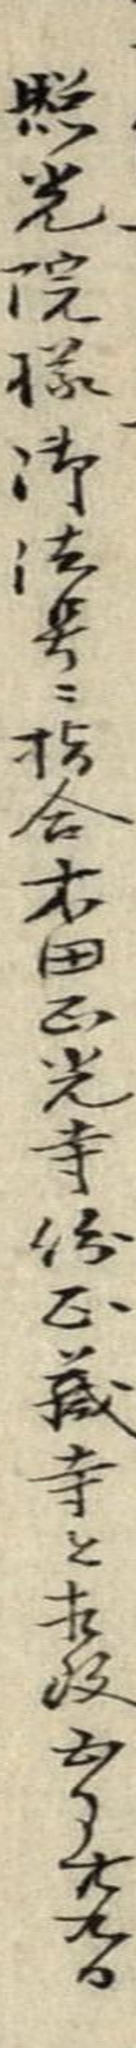照光院様御法号に指合木田正光寺儀正蔵寺と相改五月廿九日
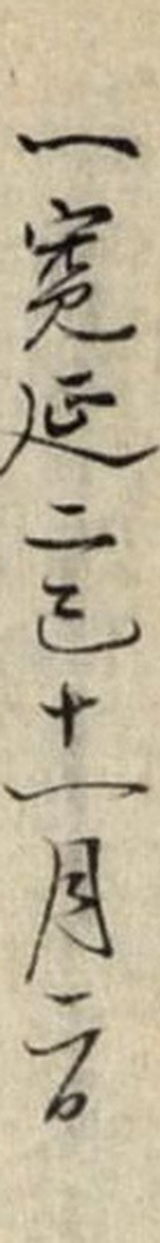一寛延二己十一月二日
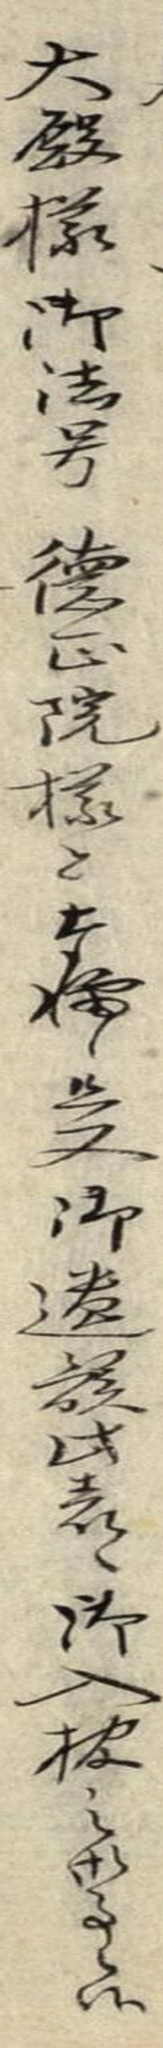大殿様御法号徳正院様と奉称候且又御遺骸此表へ御入棺之御事に候
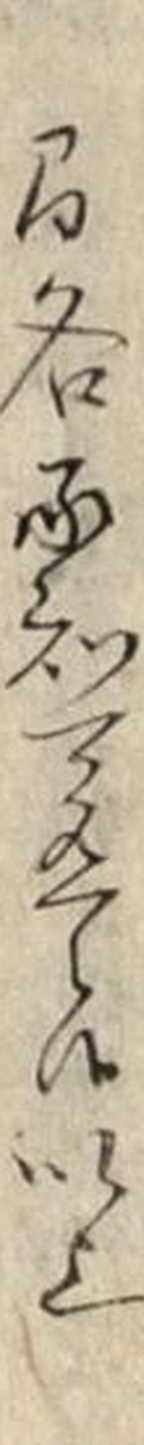間各承知可有之候以上
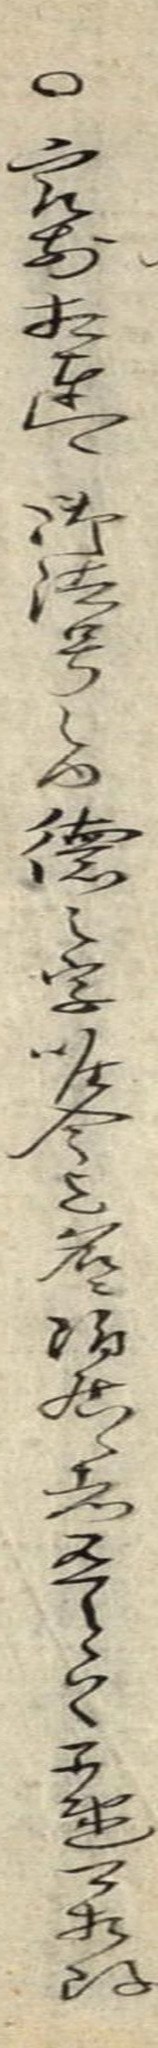○最前相達候御法号之内徳之字唯今迄名に附居候者有之候はゝ早速可相改
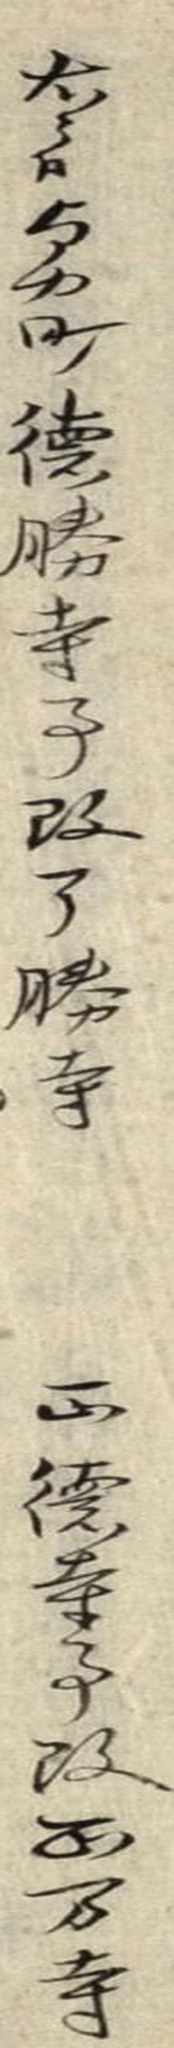右に付与力町徳勝寺事改了勝寺正徳寺事改正万寺
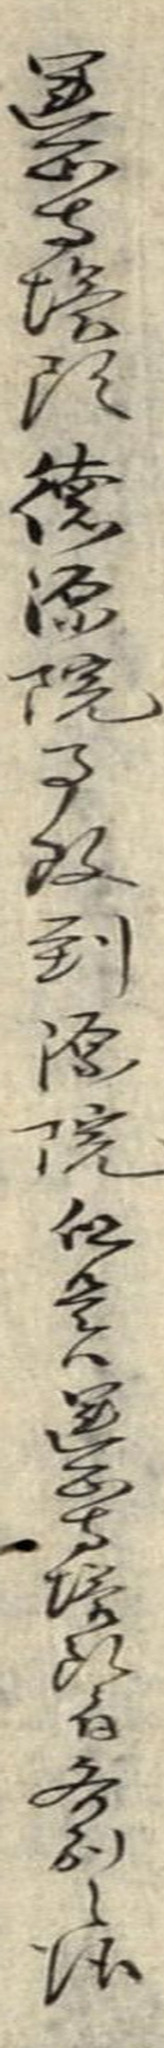運正寺塔頭徳源院事改到源院但是ハ運正寺塔頭に附各別之趣

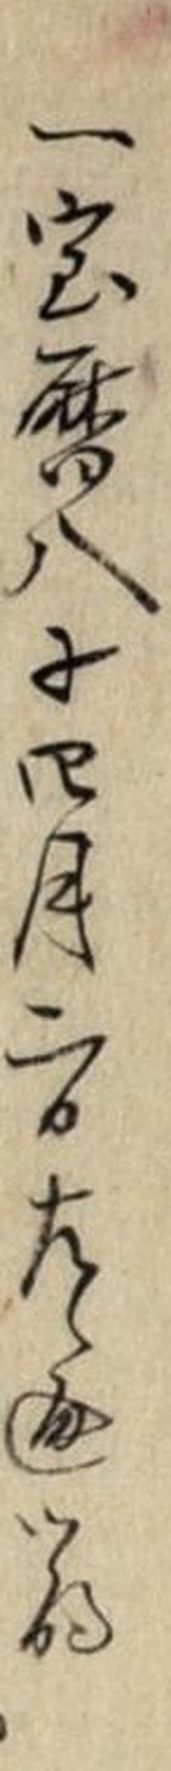一宝暦八寅四月二日左之通御触
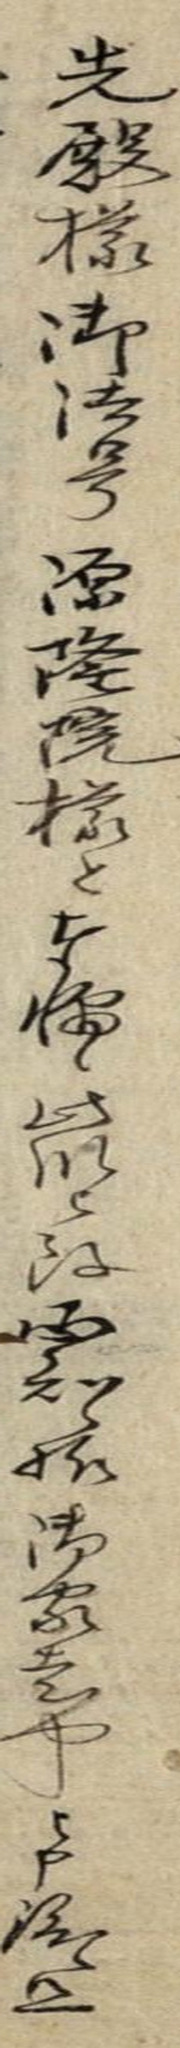先殿様御法号源隆院様と奉称候此段被致承知候様御家老中被申渡候且
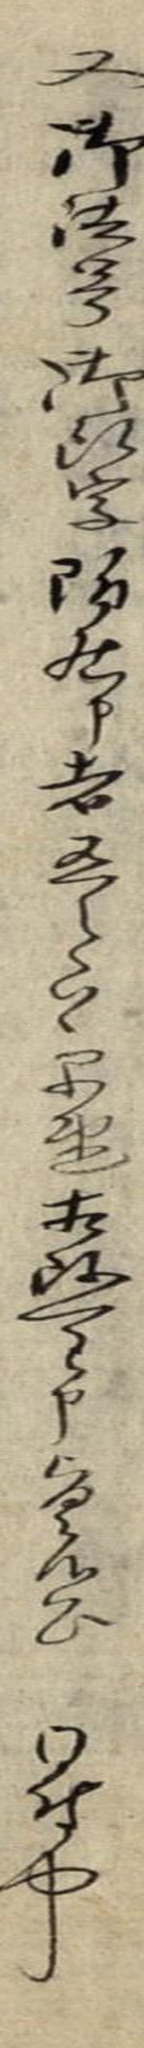又御法号御頭字附居申者有之候はゝ早速相改可申旨に候以上目付中
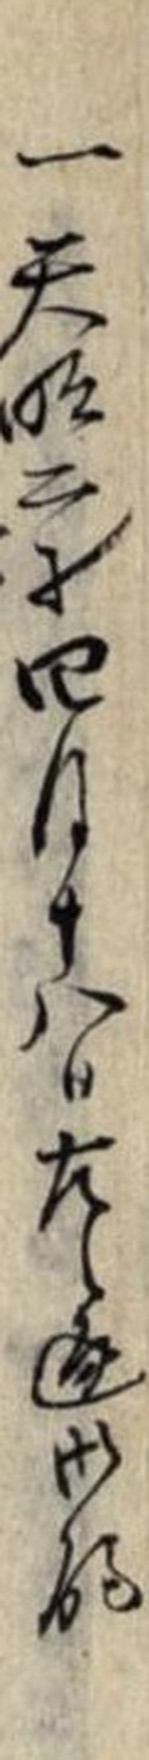一天明二寅四月十八日左之通御触
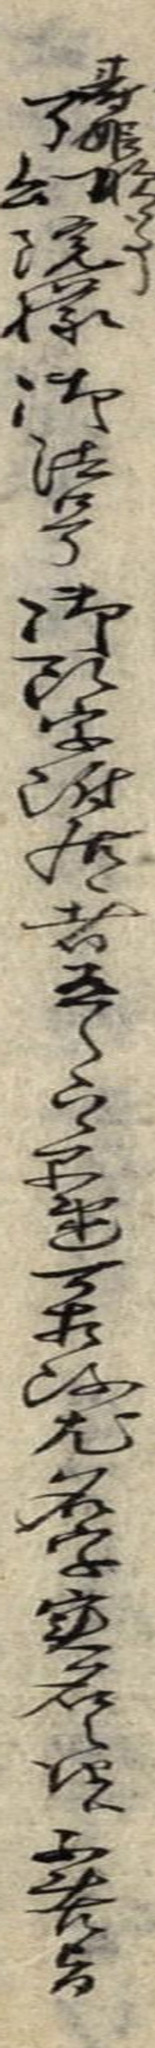了幻院様御法号御頭字附居候者有之候はゝ早速可相改尤名字実名之儀は不苦旨
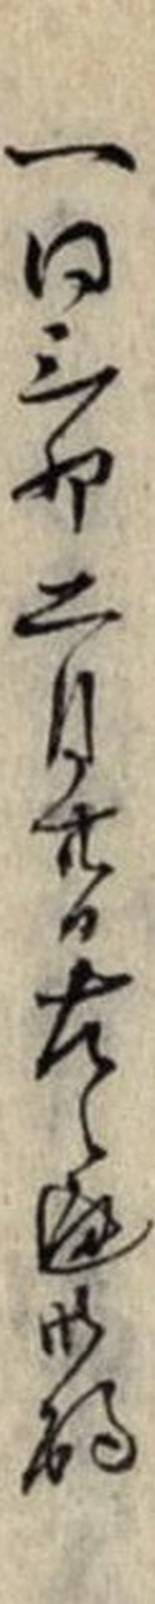一同三卯二月廿日左之通御触
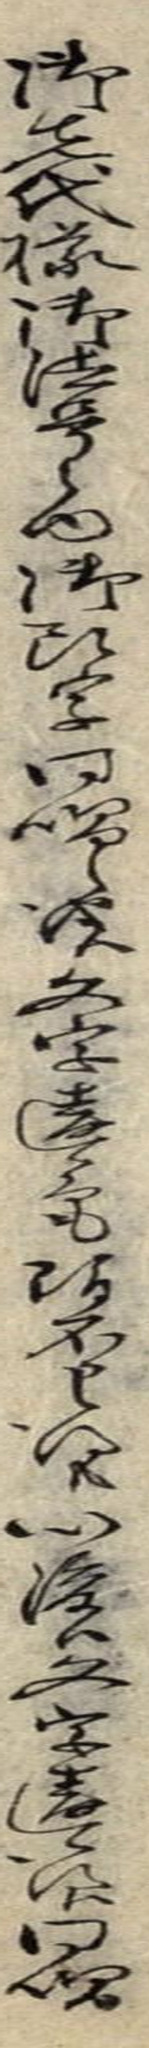御先代様御法号之内御頭字同唱之儀は文字違に而も附不申候得共以後は文字違に候得は同唱
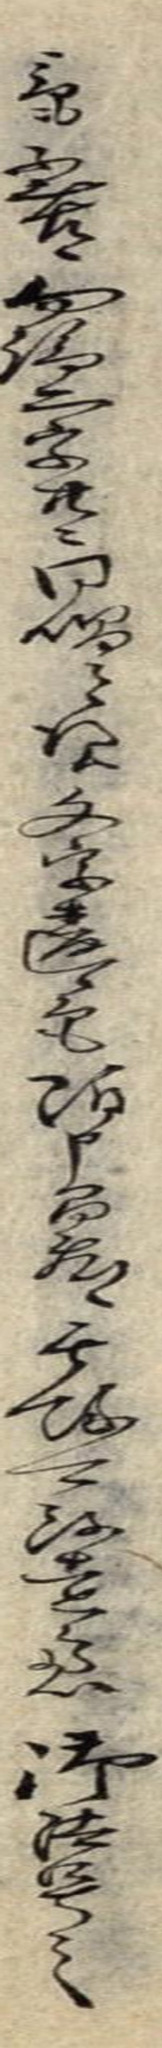に而も不苦候勿論二字共に同唱に候得は文字違に而も附申間敷候其余可致遠慮御法号之
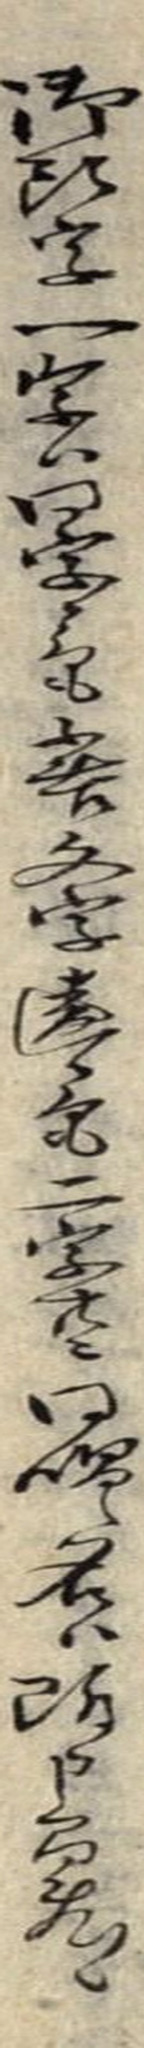御頭字一字は同字に而も不苦文字違に而も二字共に同唱之名は附申間敷候
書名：蒐輯之部
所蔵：福井県文書館 Fukui Prefectural Archives
